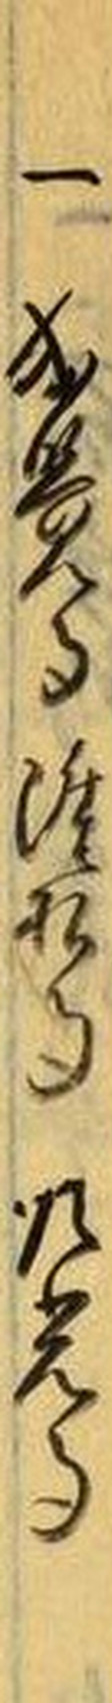一成覚寺隆松寺順光寺
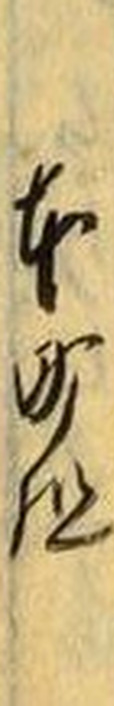本町組
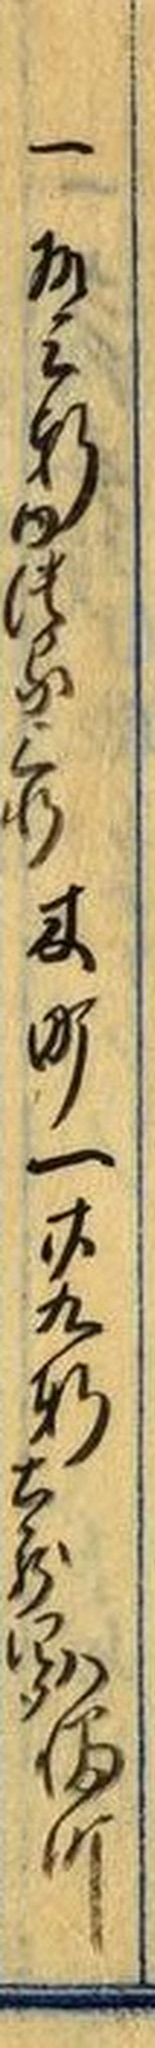一拾三軒内潰家三軒木町一廿九軒土蔵四ッ八幡町
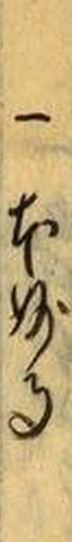一本妙寺
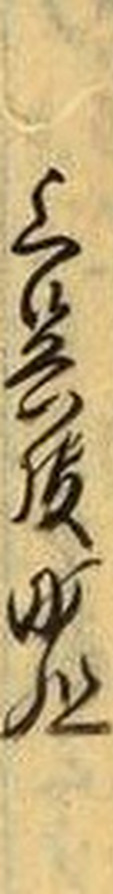上呉服町組
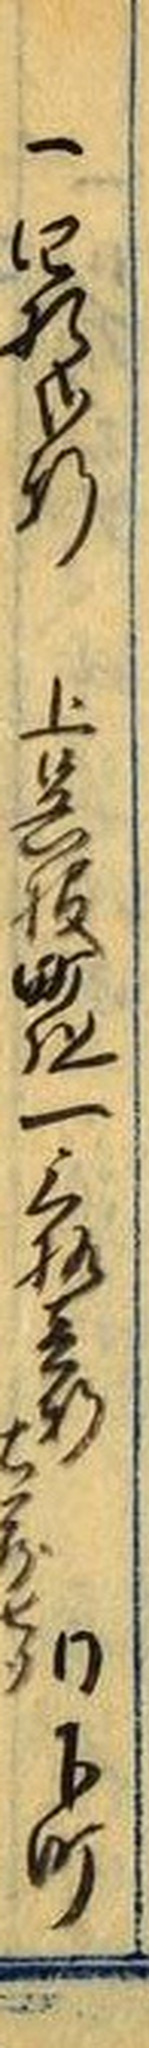一四拾弐軒上呉服町組一三拾壱軒土蔵七ッ同下町

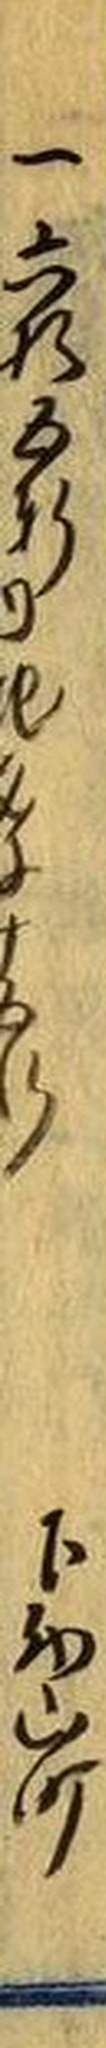一六拾五軒内地名子十五軒下西山町
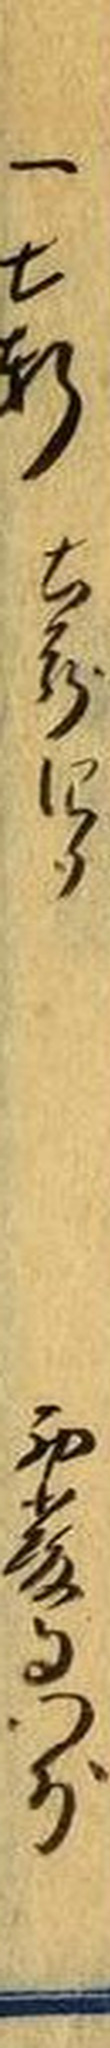一七軒土蔵四ッ西厳寺門前
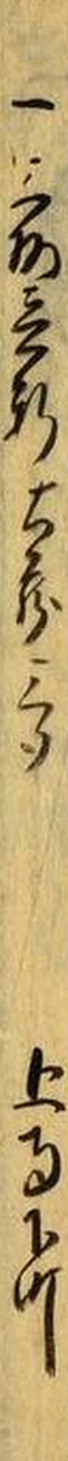一三拾壱軒土蔵三ッ上高下町
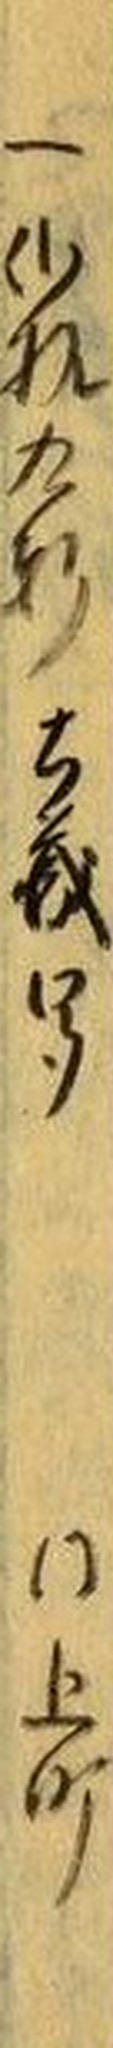一弐拾九軒土蔵四ッ同上町
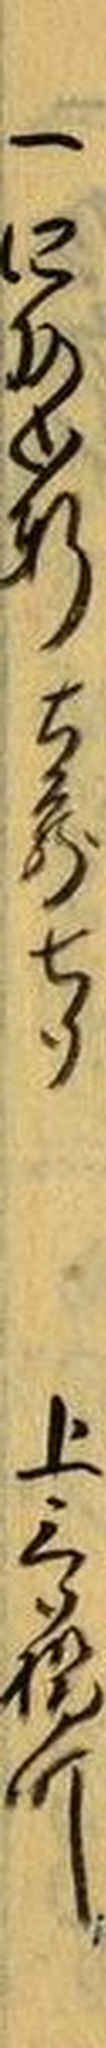一四拾弐軒土蔵七ッ上三ッ橋町
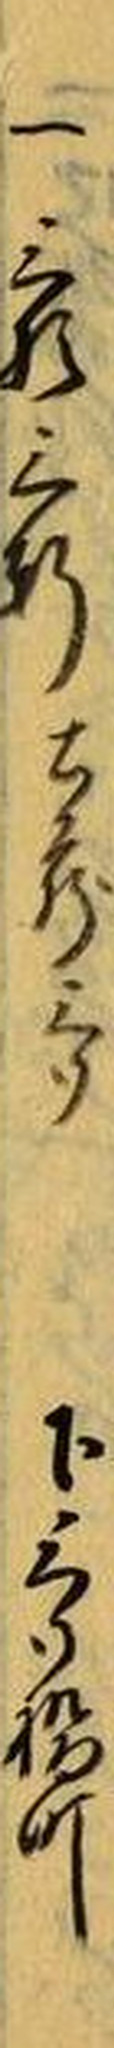一三拾壱軒土蔵三ッ上高下町
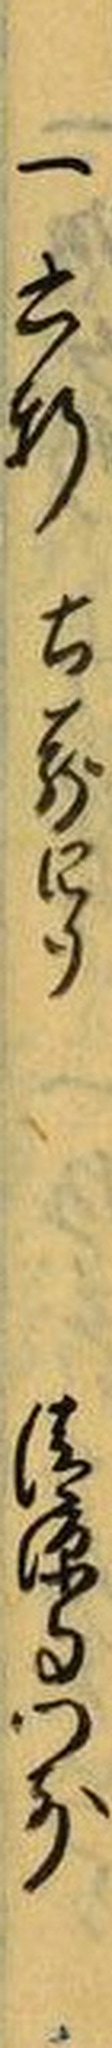一七軒土蔵四ッ西厳寺門前
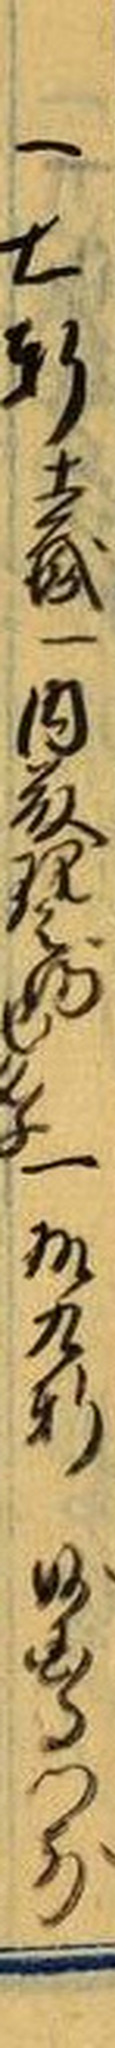一七軒土蔵一内藤理兵衛地名子一拾九軒妙国寺門前
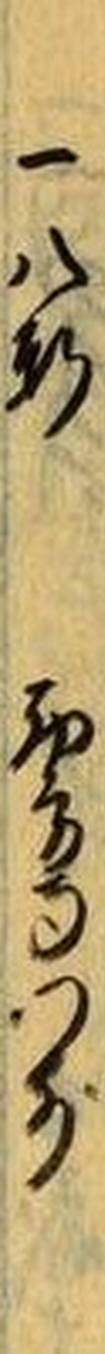一八軒西方寺門前
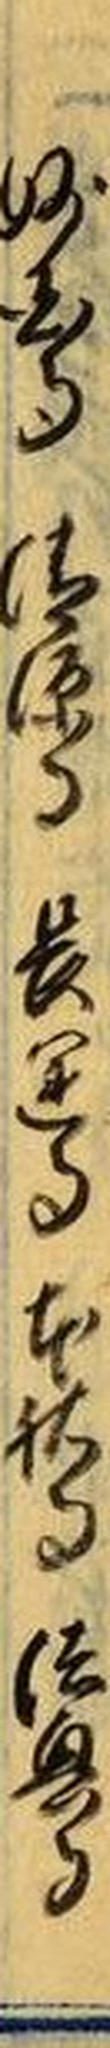妙国寺清涼寺長運寺本祐寺法興寺
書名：温古集 五巻
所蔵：福井県文書館 Fukui Prefectural Archives
